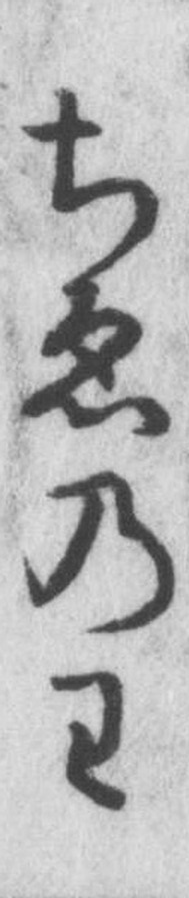ちゑ乃わ

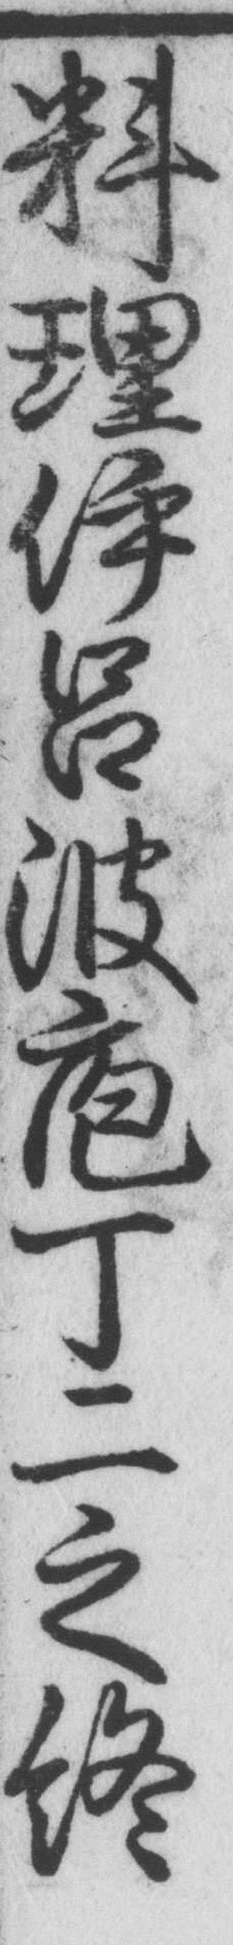料理伊呂波庖丁二之終

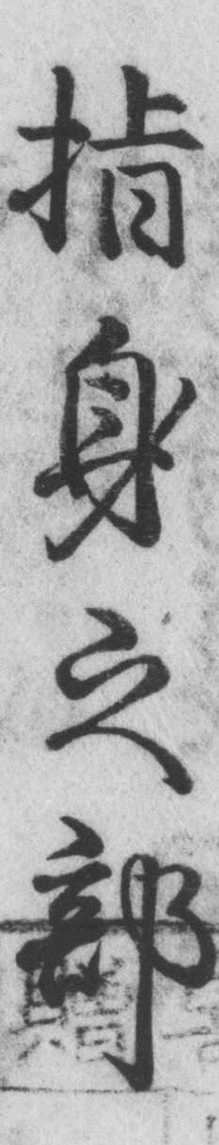指身之部

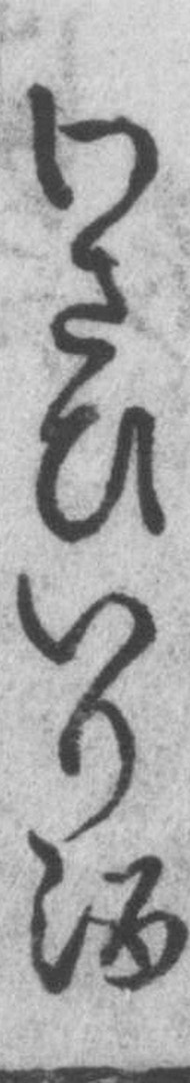わさびいり酒
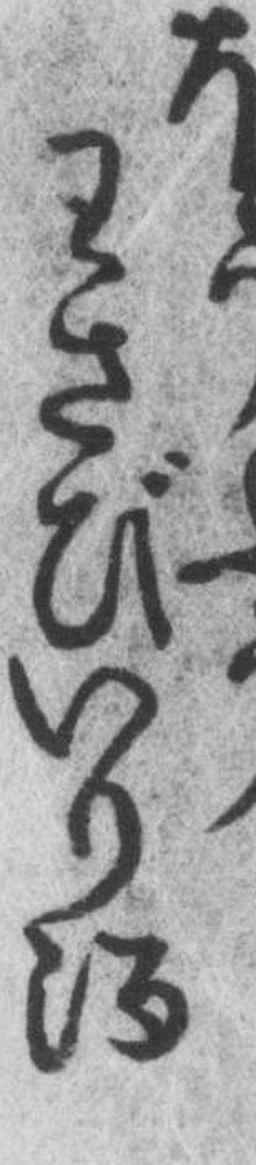わさびいり酒
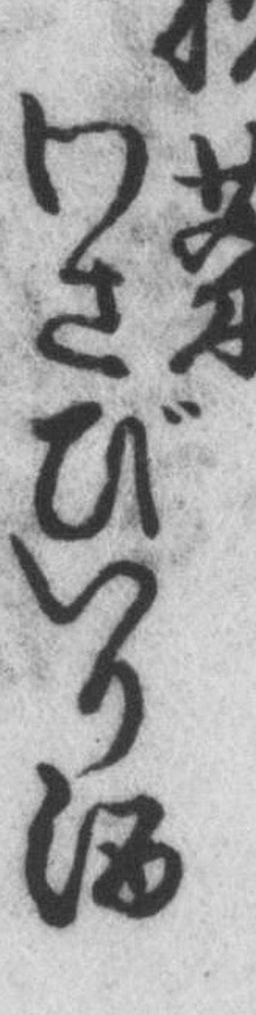わさびいり酒
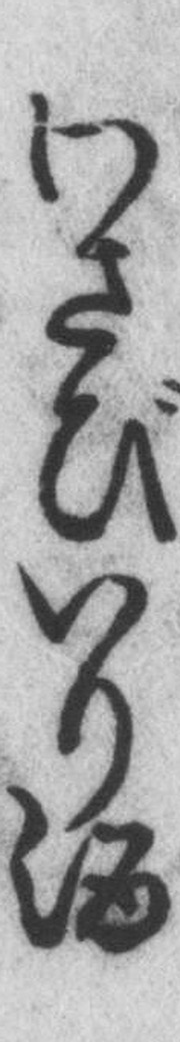わさびいり酒

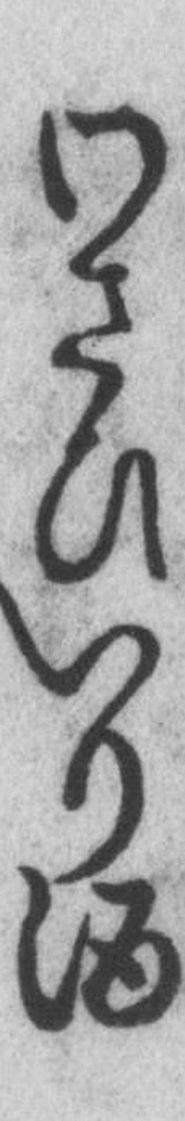わさびいり酒
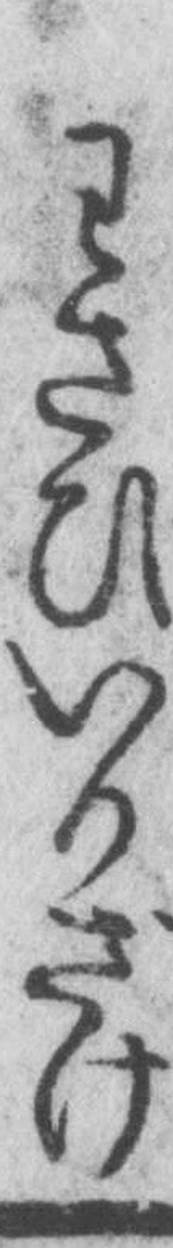わさびいり酒
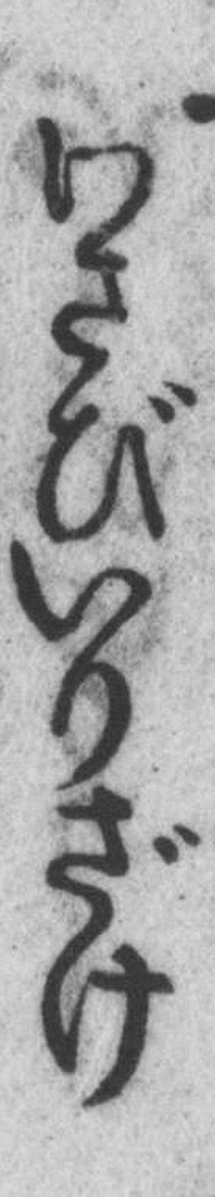わさびいり酒
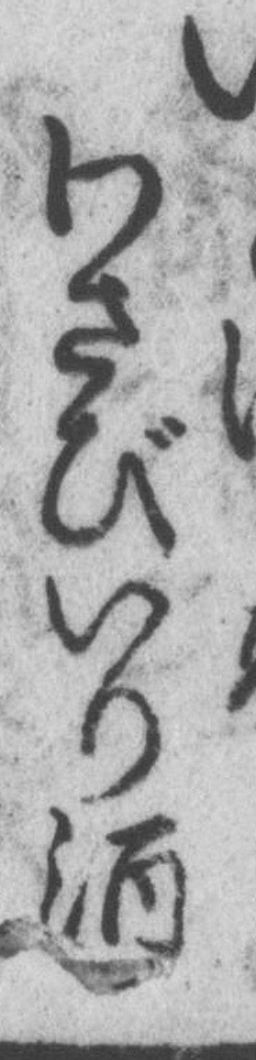わさびいり酒
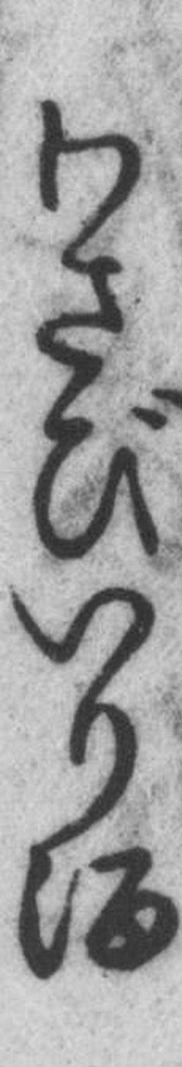わさびいり酒
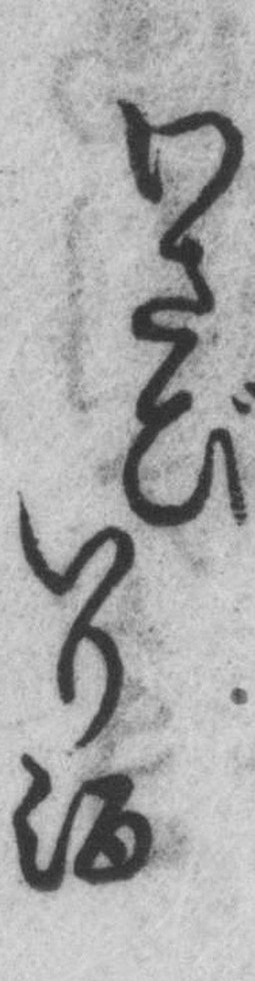わさびいり酒

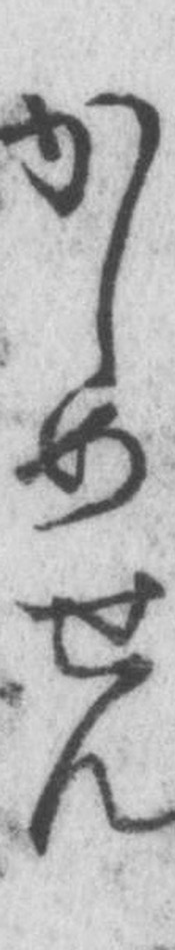から皮せん
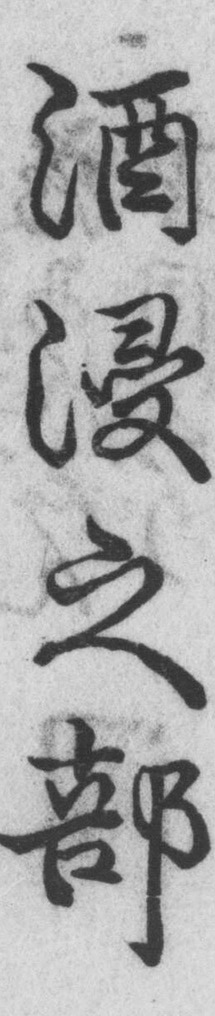酒浸之部
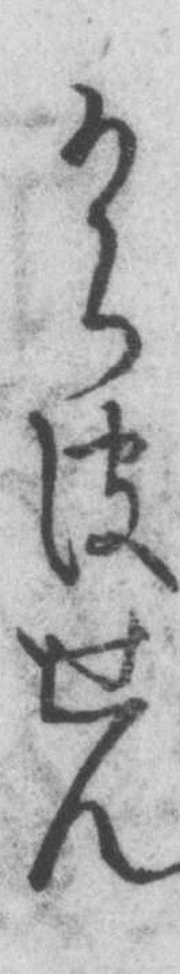から皮せん
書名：料理伊呂波庖丁
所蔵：大阪府立大学学術情報センター 国文学研究資料館
